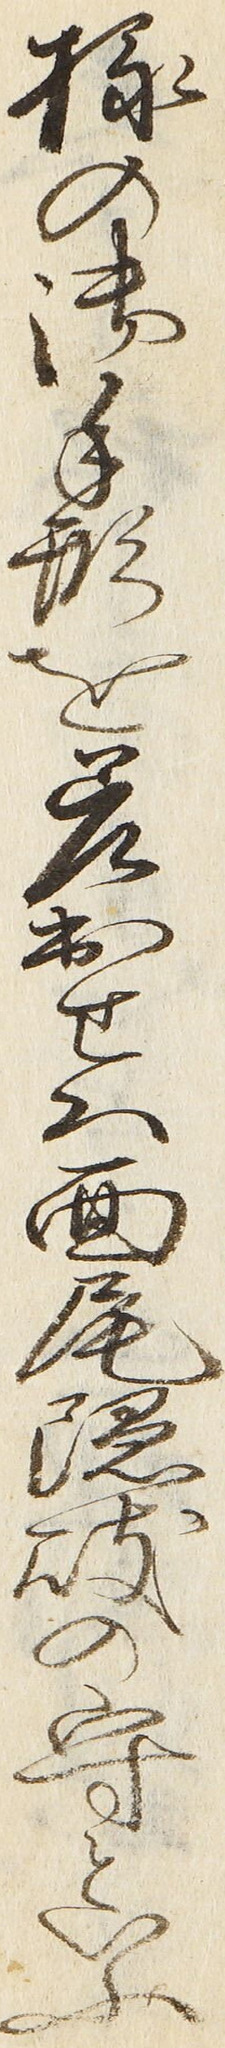様の御手形を差出せは西尾隠岐の守といふ
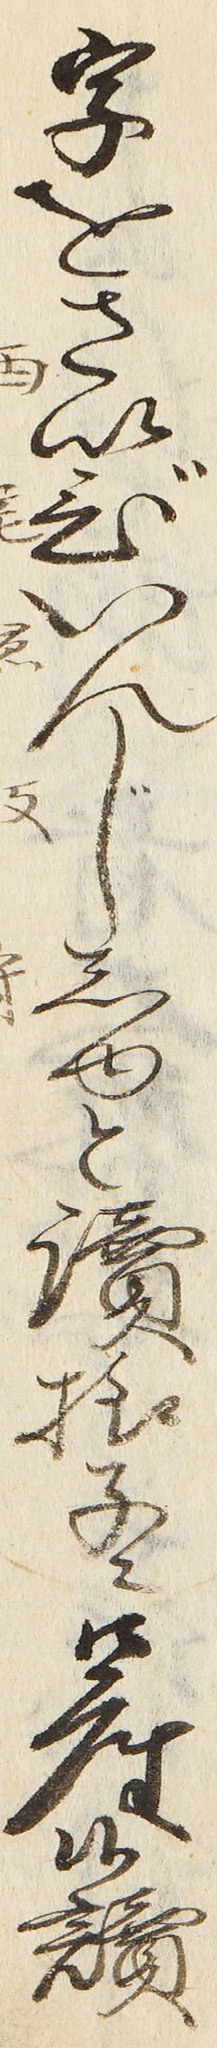字をさいびいんじやと読様子に御座候読
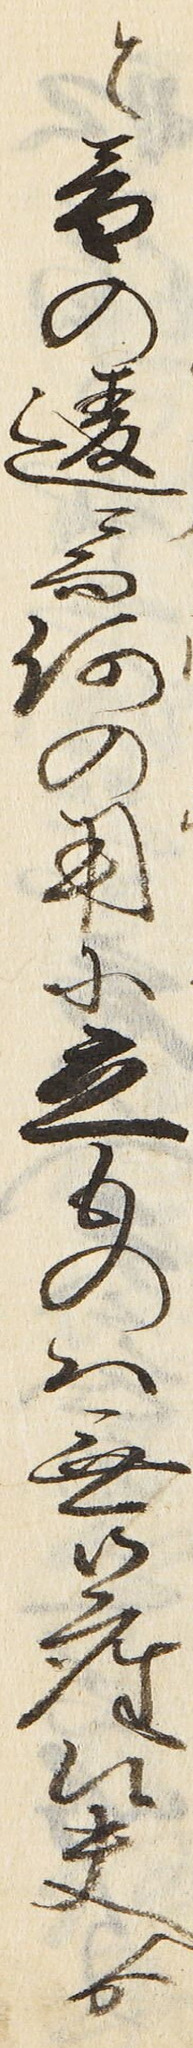と音の違にて何の用に立ものは無御座候夫ゟ
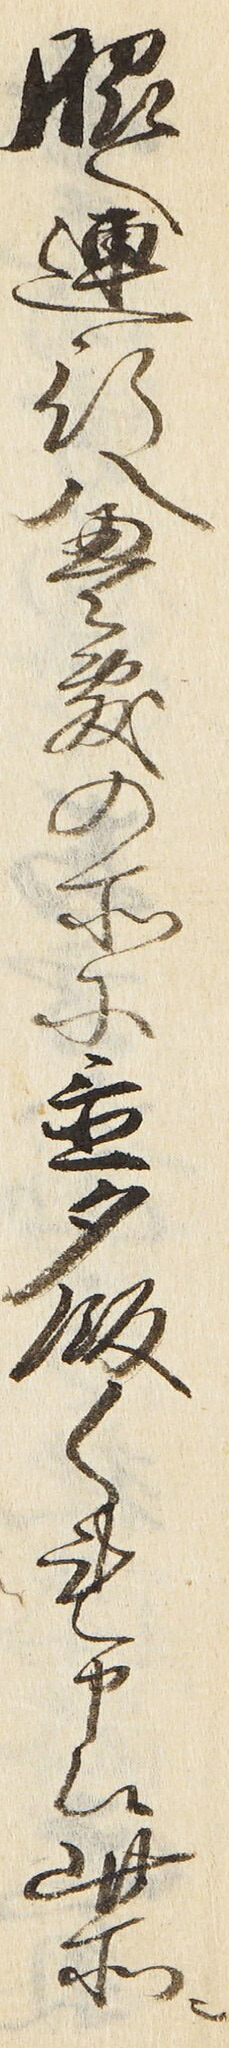脇へ蓮行八畳敷の所に置夕飯くれ申候此所に
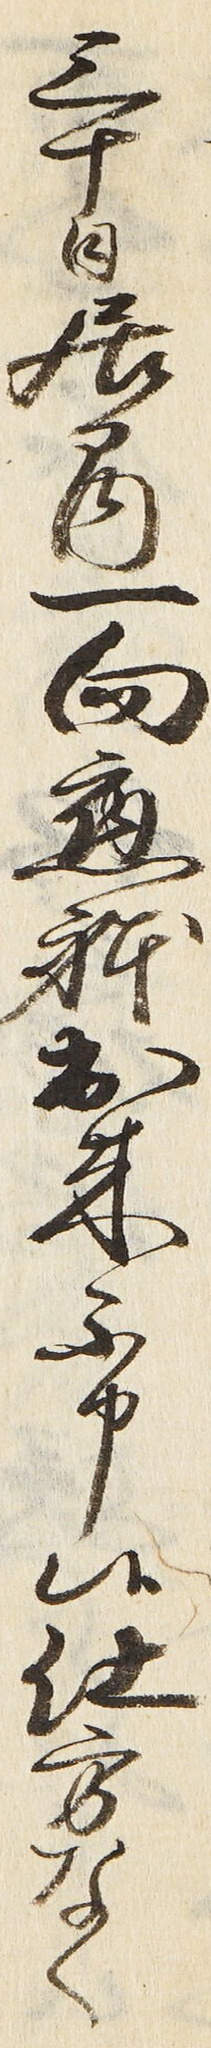三十日居る内一向応体出来不申候仕方なく
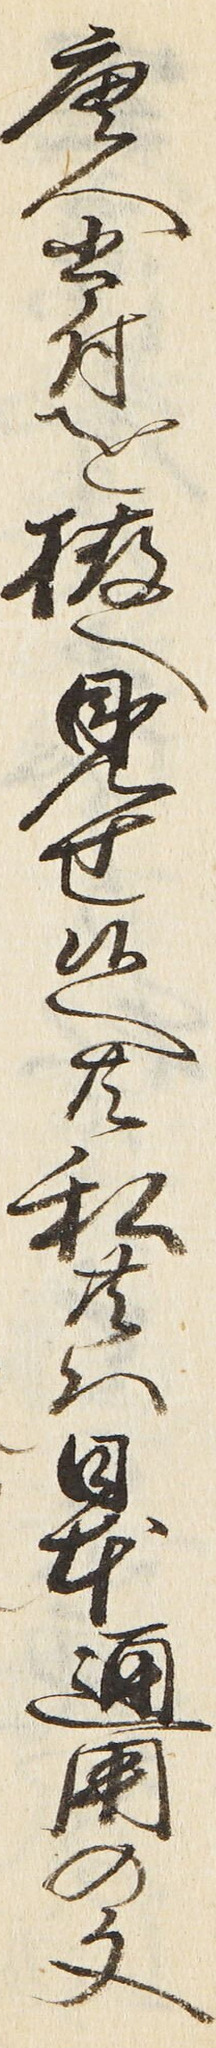唐人云付を拵へ見せ候へ共私共は日本通用の文
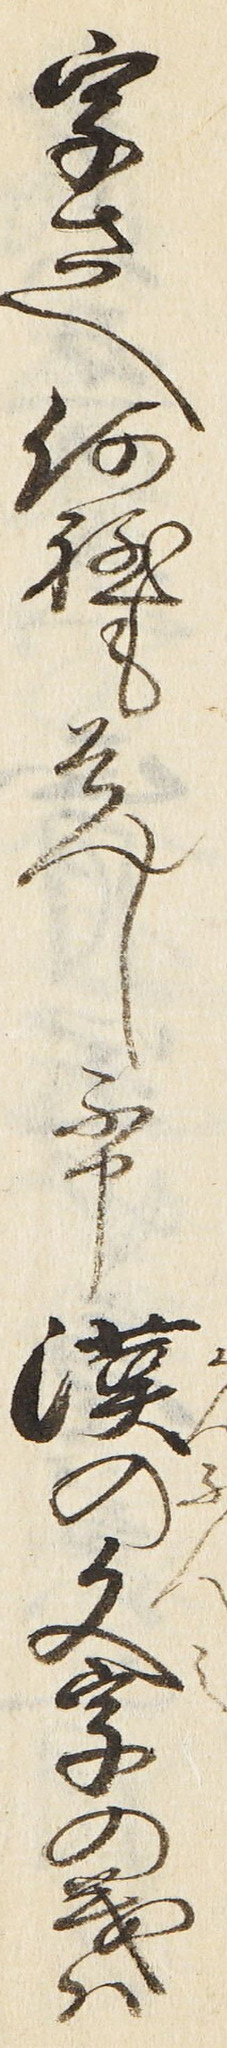字さへ何程もそんし不申漢文字の義は
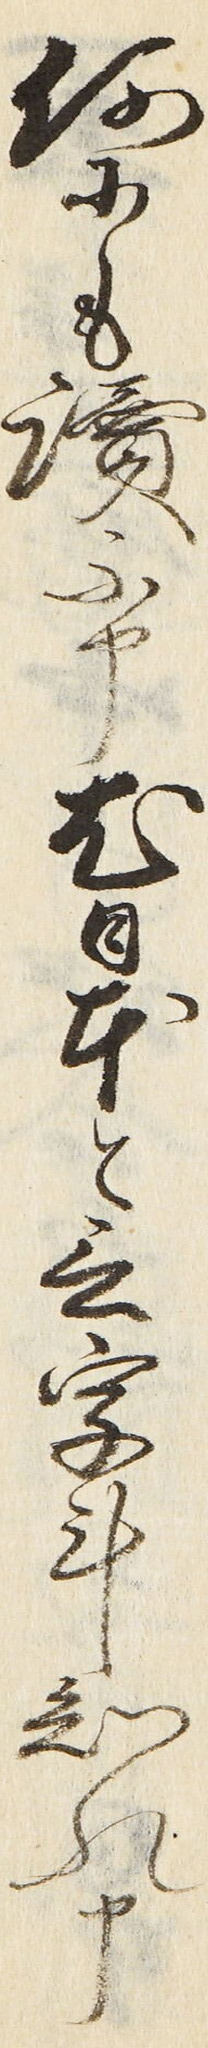何にも読不申尤日本と云字計知れ申
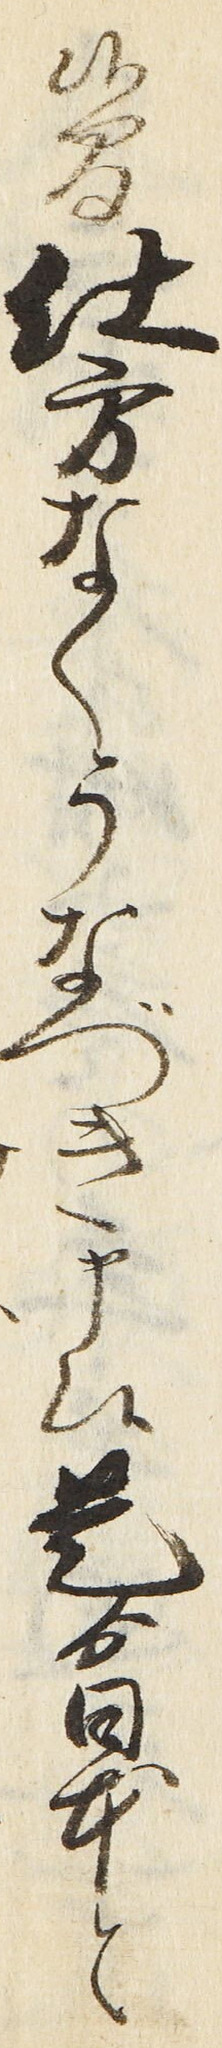候間仕方なくうなづき申候是ゟ日本と
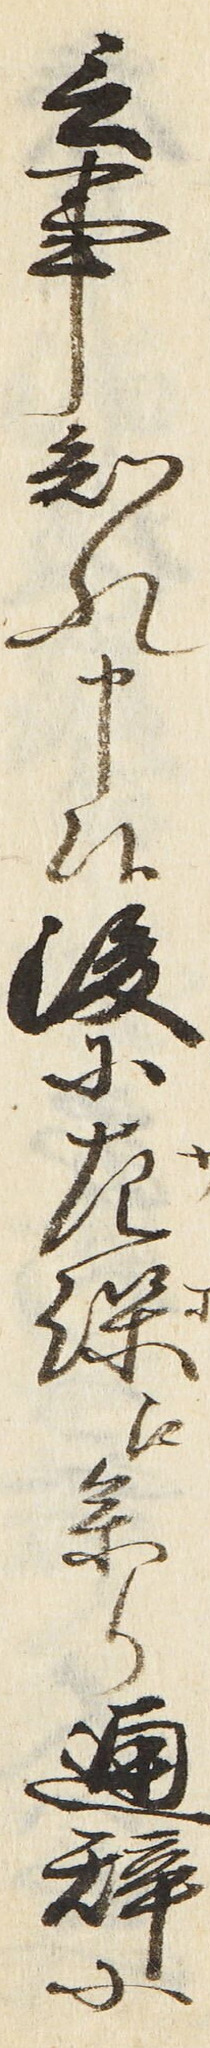云事知れ申候後に左保え参り通辞に
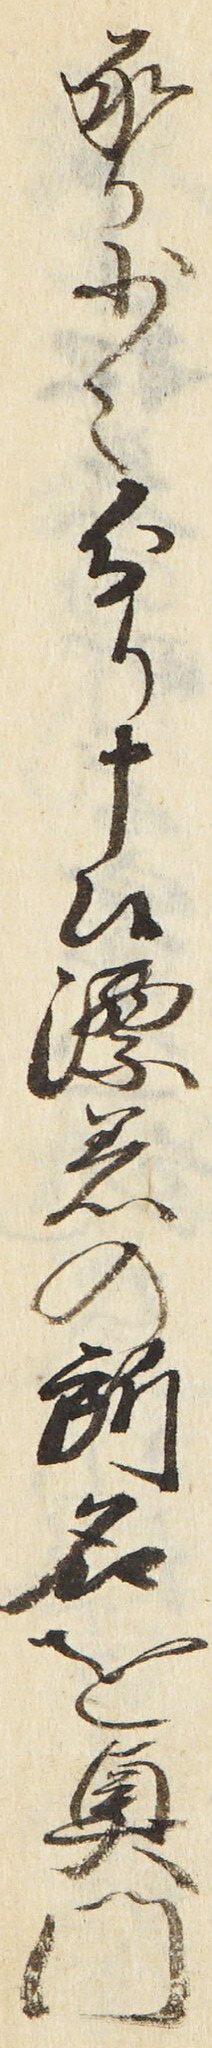承り少々分り申候漂着の所名を奥門

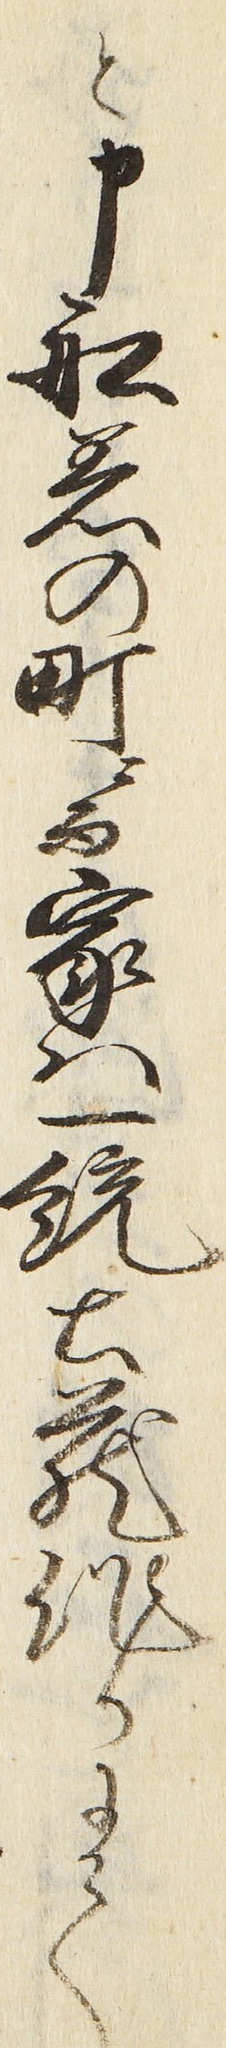と申船着の町にて家は一統土蔵作りにて
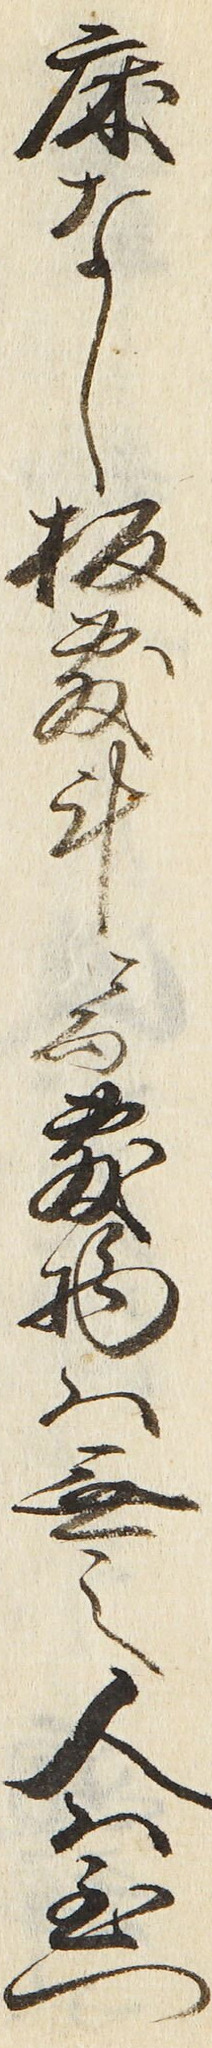床なし板敷計にて敷物は無之人は至つ
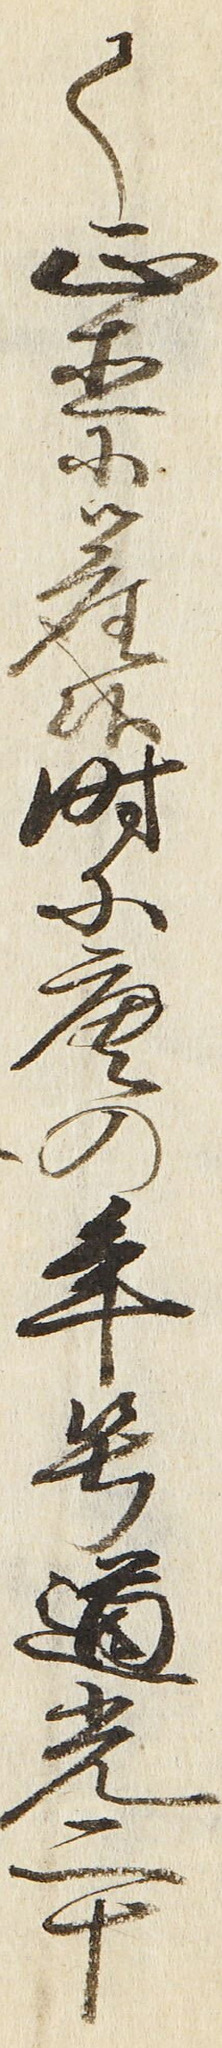て正直に御座候時に唐の年号通光二十
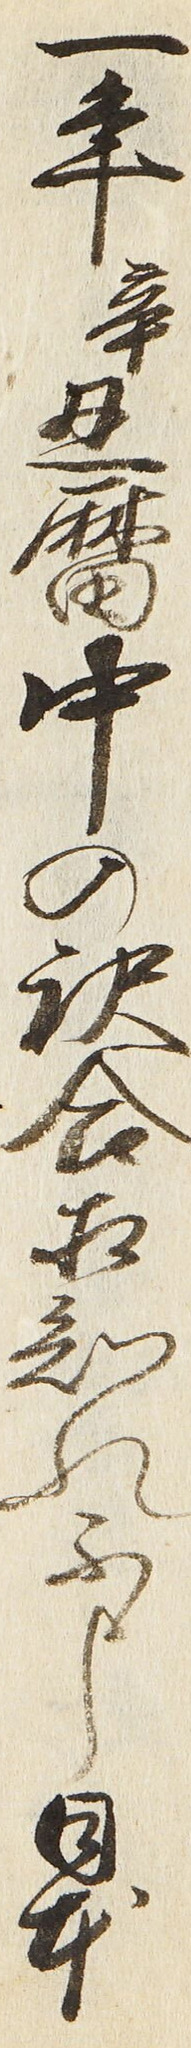一年辛丑暦中の決合相知れ不申日本
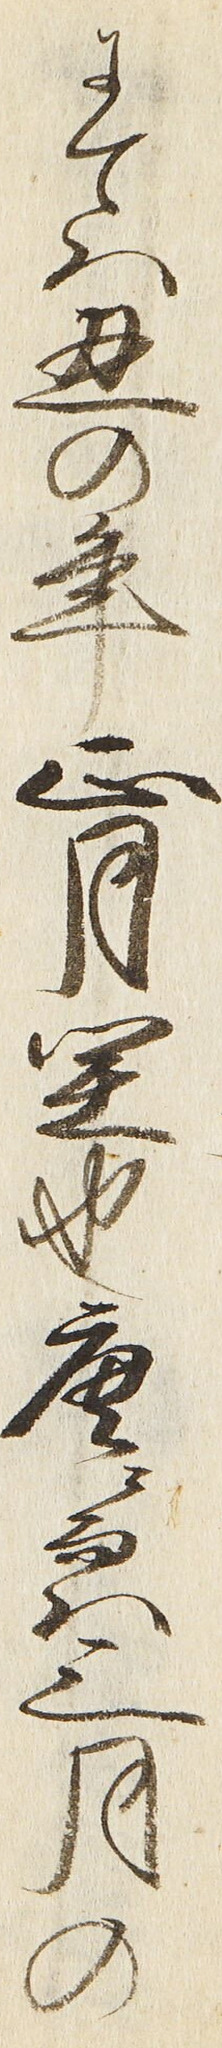にては丑の年正月閏也唐にては三月の
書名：天保漂流記
